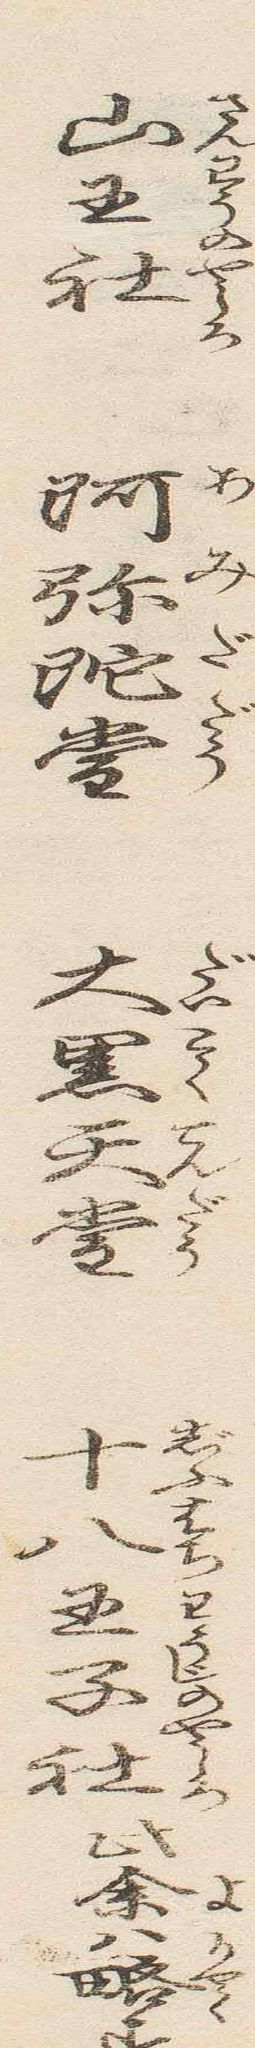山王社阿弥陀堂大黒天堂十八王子社此余は略す
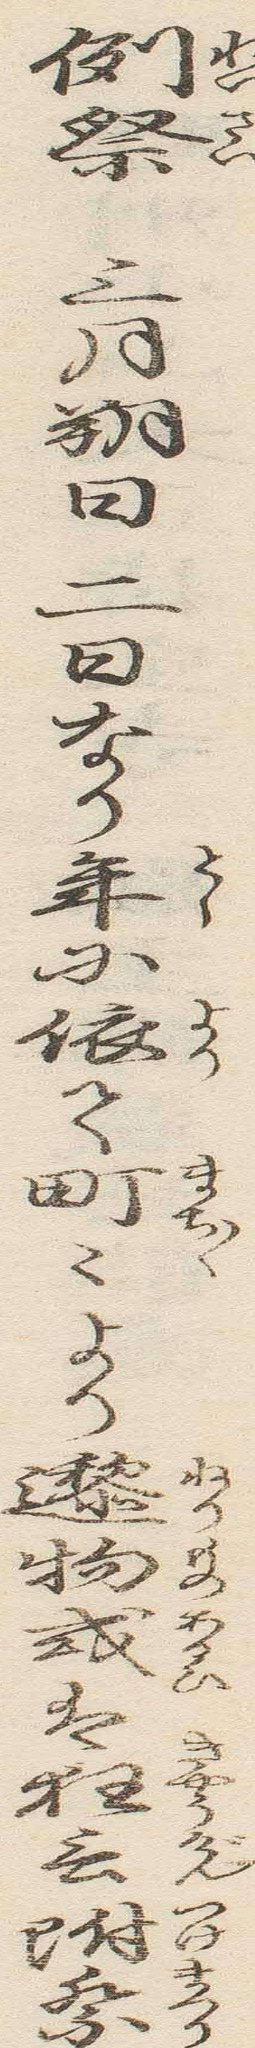例祭三月朔日二日なり年に依て町〻より邌物或は狂言附祭
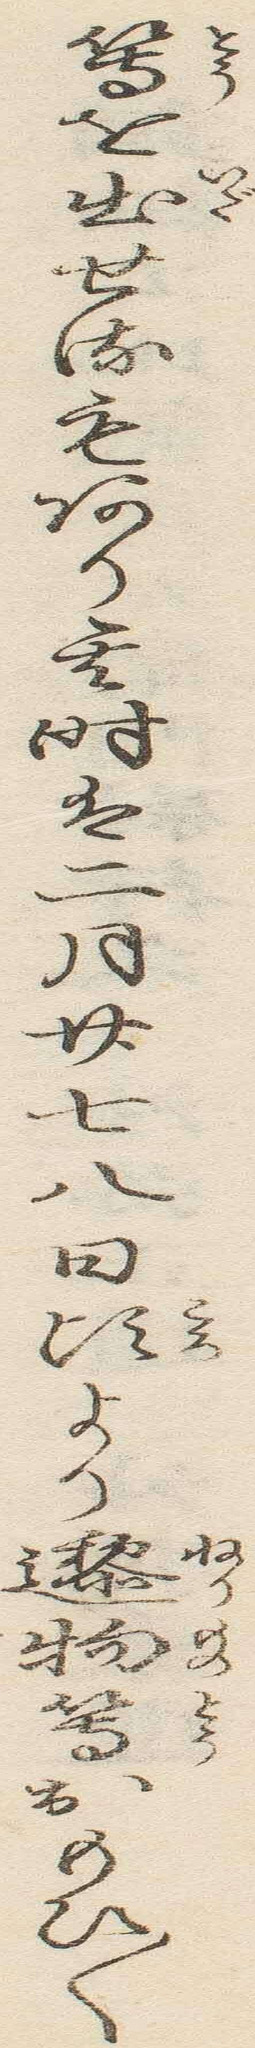等を出せるもあり其时は二月廿七八日頃より邌物等おもひ〳〵
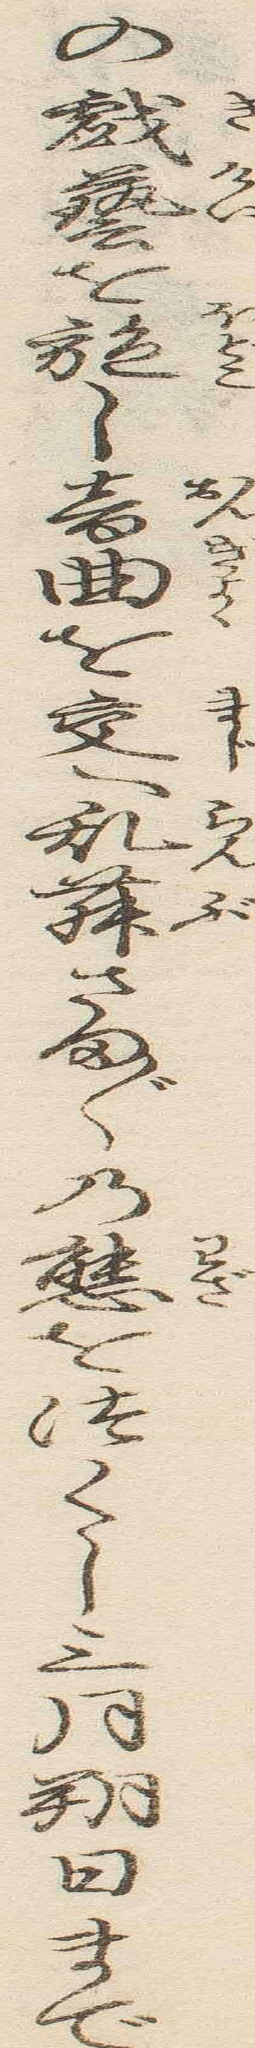の戯藝を施し音曲を交へ乱舞さま〴〵の態をつくし三月朔日まで
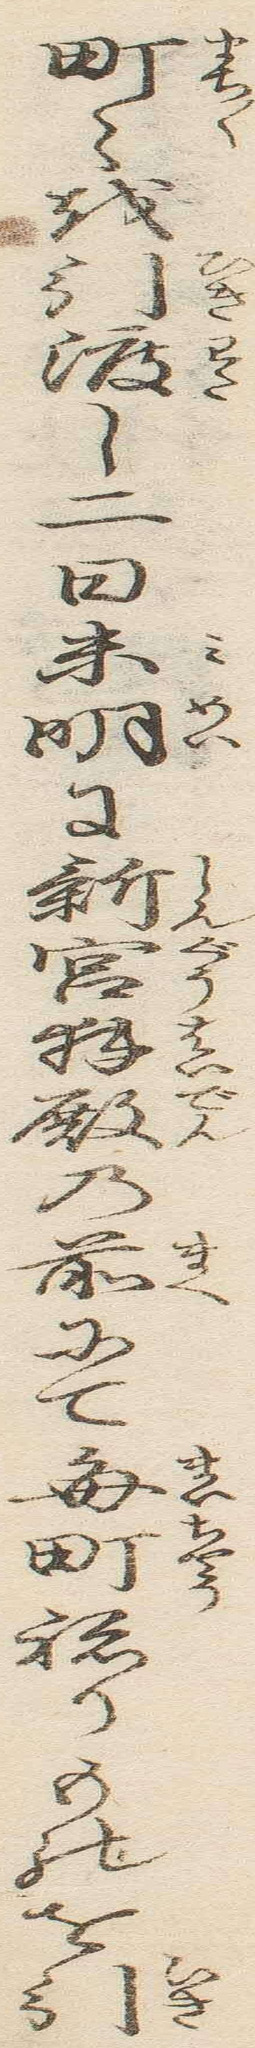町〻を引渡し二日未明に新宮拜殿の前にて毎町ねりものを引
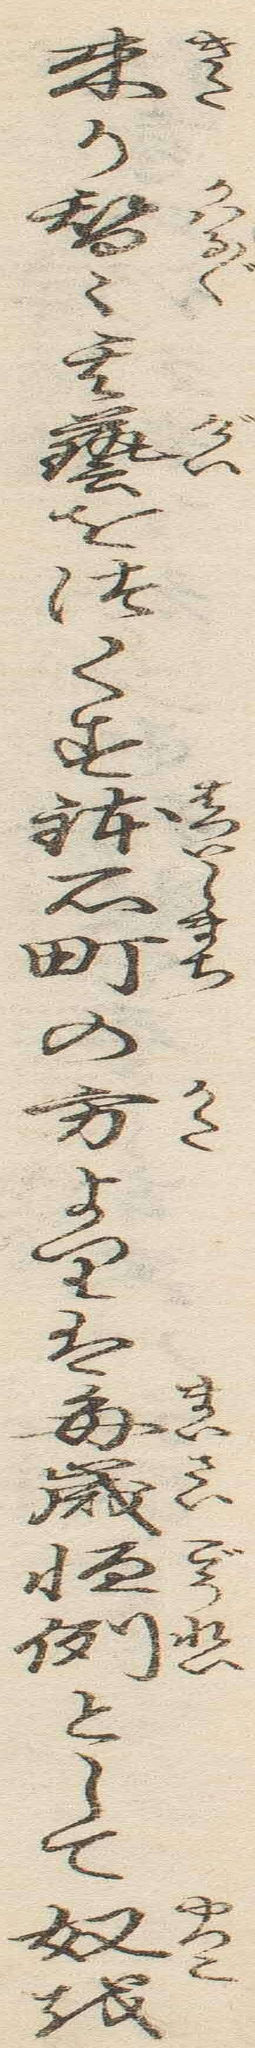来り替〻其藝をつくす鉢石町の方よりは毎歳恒例として奴を
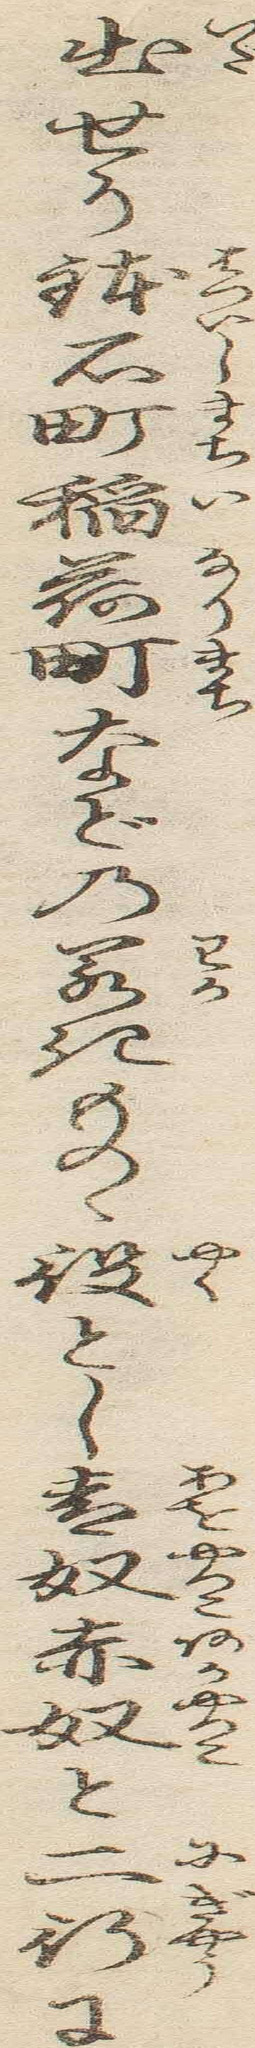出せり鉢石町稲荷町などの若きものゝ役とし青奴赤奴と二行に
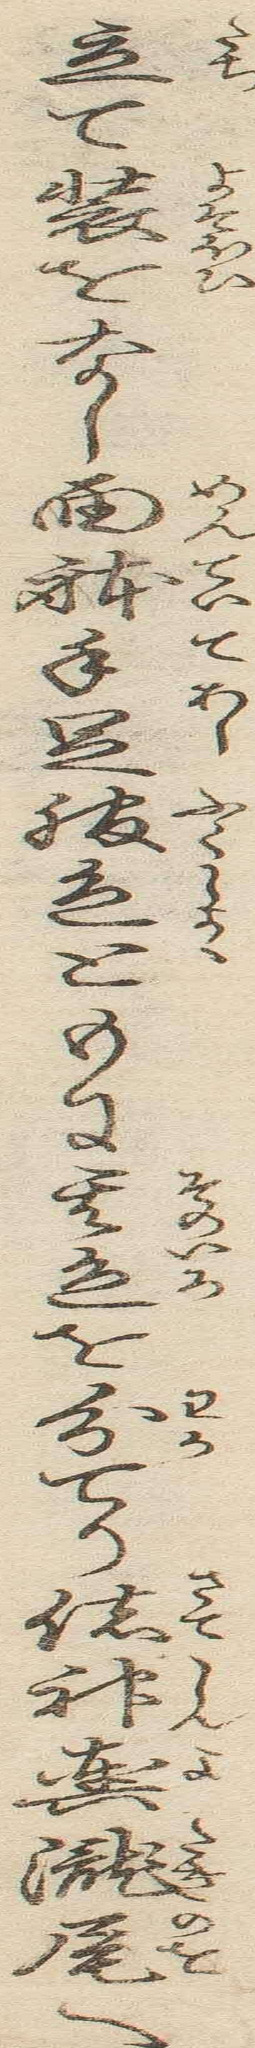立て装をなし面躰手足服色ともに其色を分てり偖神輿瀧尾へ

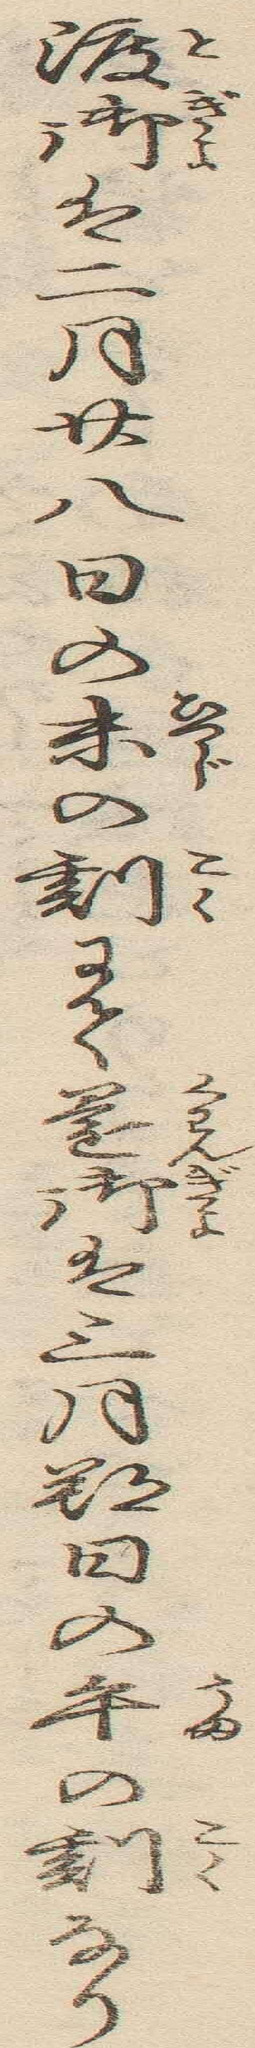渡御は二月廿八日の未の刻にて還御は三月朔日の午の刻なり
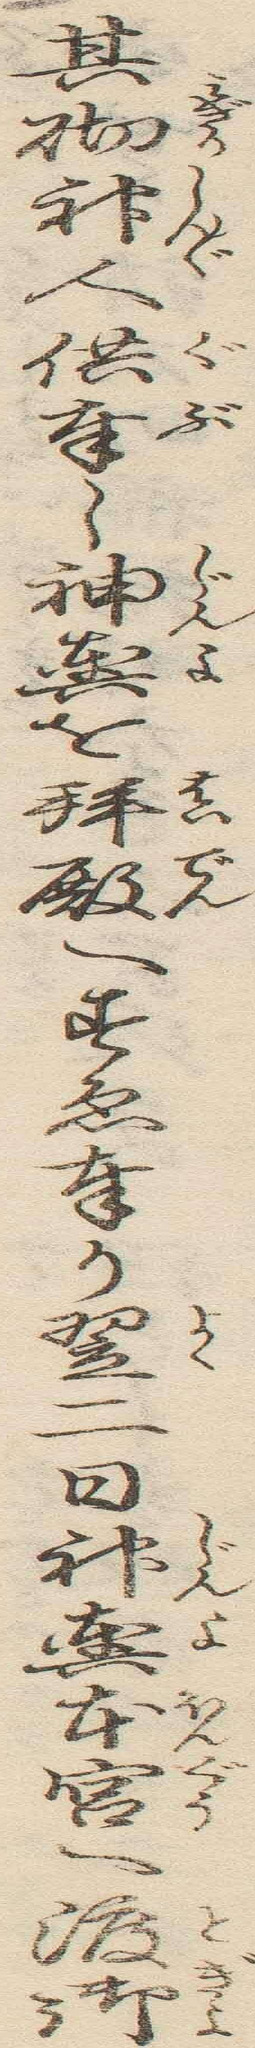其砌神人供奉し神輿を拜殿へすゑ奉り翌二日神輿本宮へ渡御
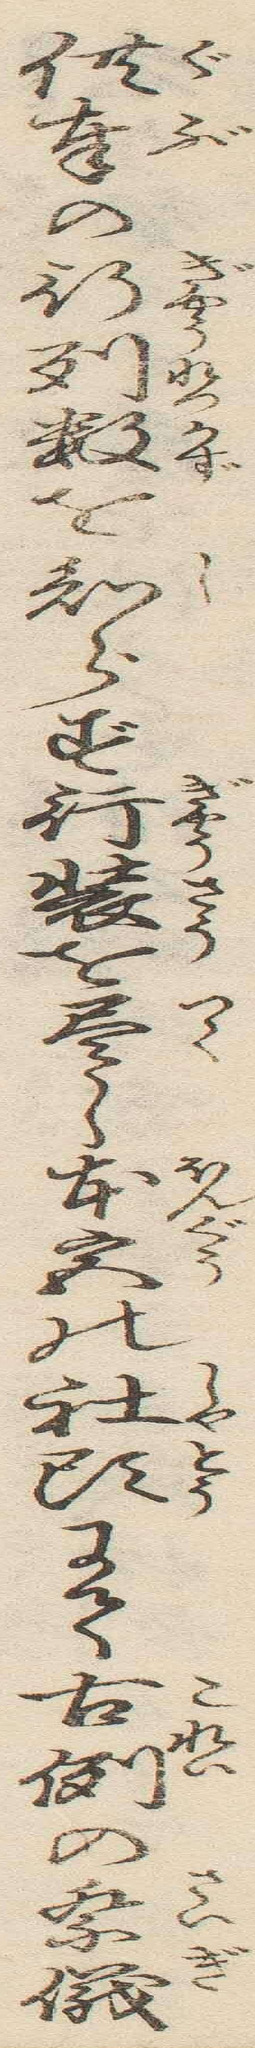供奉の行列数を知らず行装を尽し本宮の社頭にて古例の祭儀
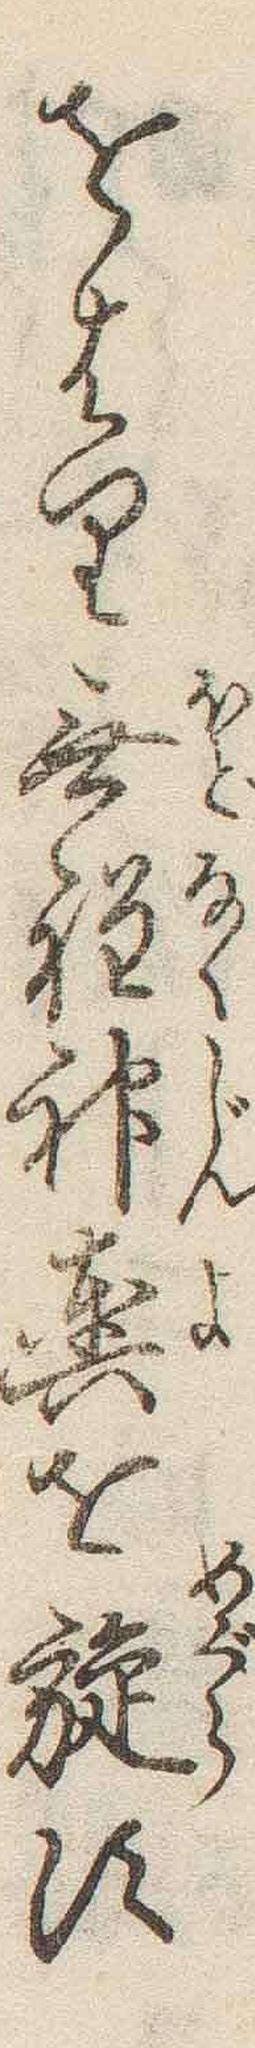をはり無程神輿を旋す
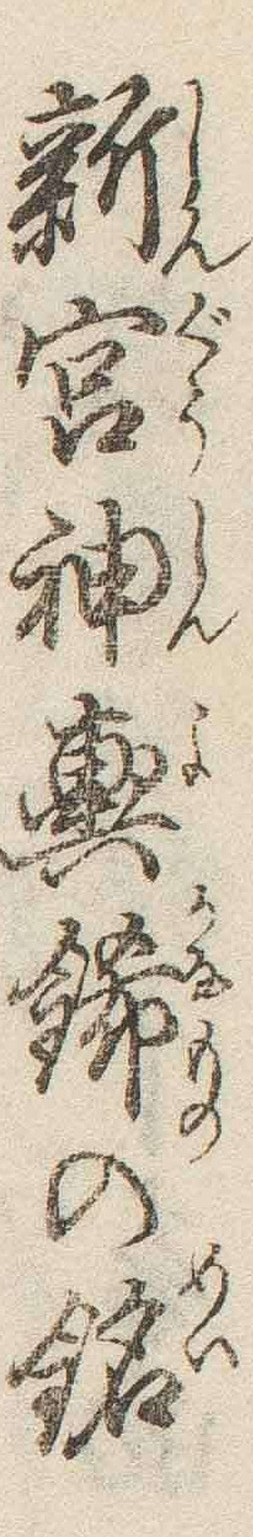新宮神輿䤭の銘
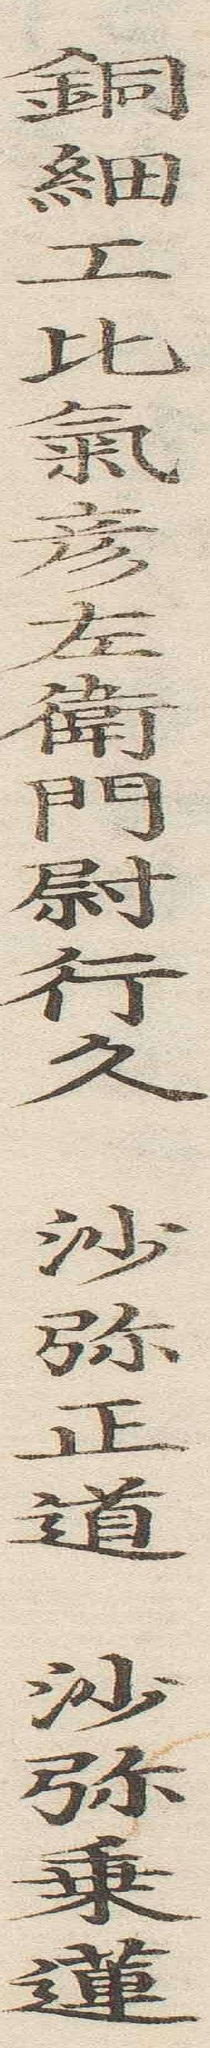銅細工比氣彦左衛門尉行久沙弥正道沙弥乗蓮
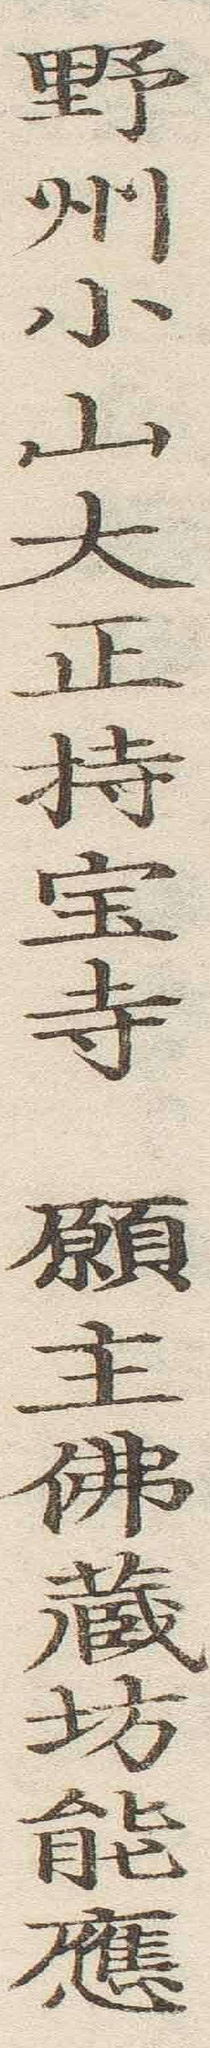野州小山大正持宝寺願主佛蔵坊能應
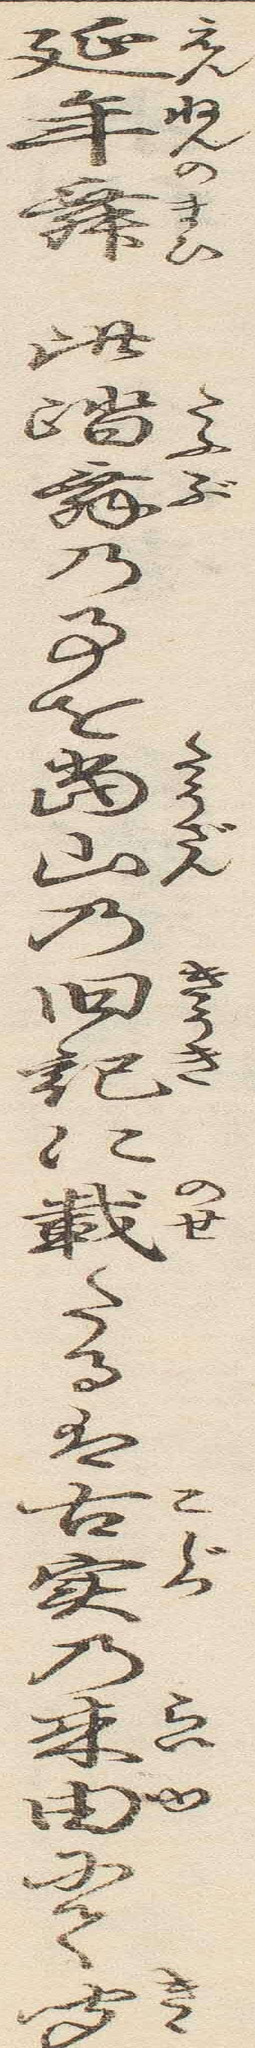延年舞此踏舞の事を當山の旧記に載たるは古実の来由にて聞
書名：日光山志
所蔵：東京学芸大学附属図書館 国文学研究資料館
